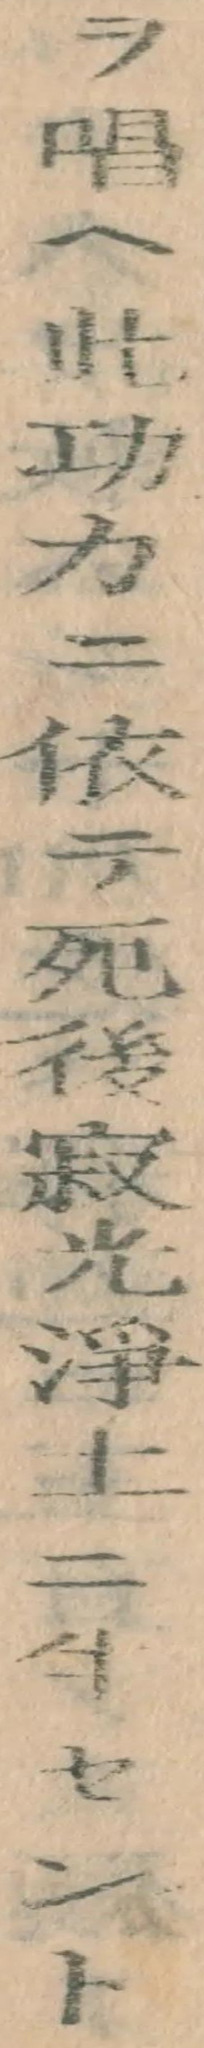ヲ唱ヘ此功力ニ依テ死後寂光浄土ニ生セント
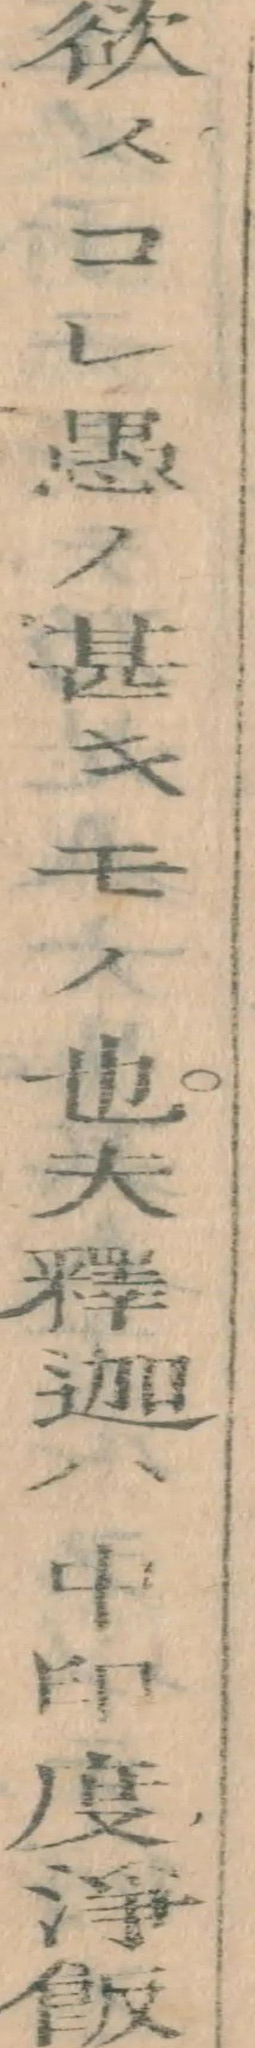欲ス。コレ愚ノ甚キモノ也。夫釈迦ハ中印度浄飯

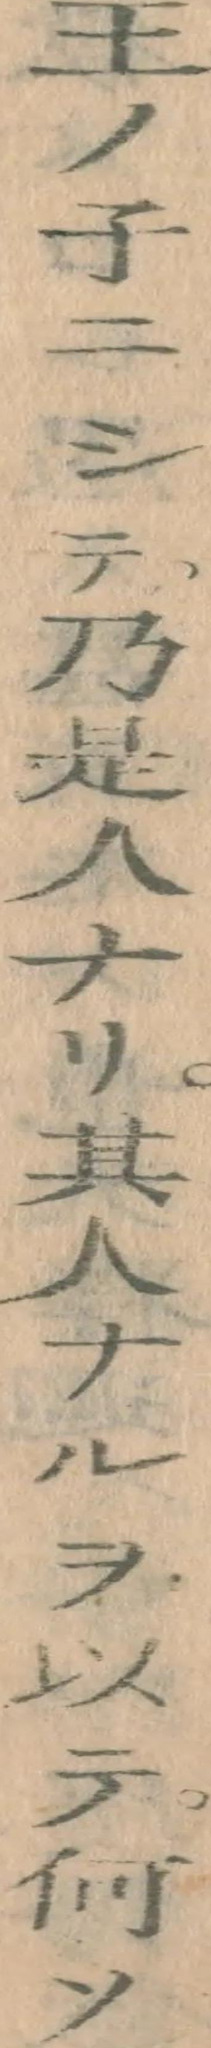王ノ子ニシテ。乃是人ナリ。其人ナルヲ以テ。何ソ
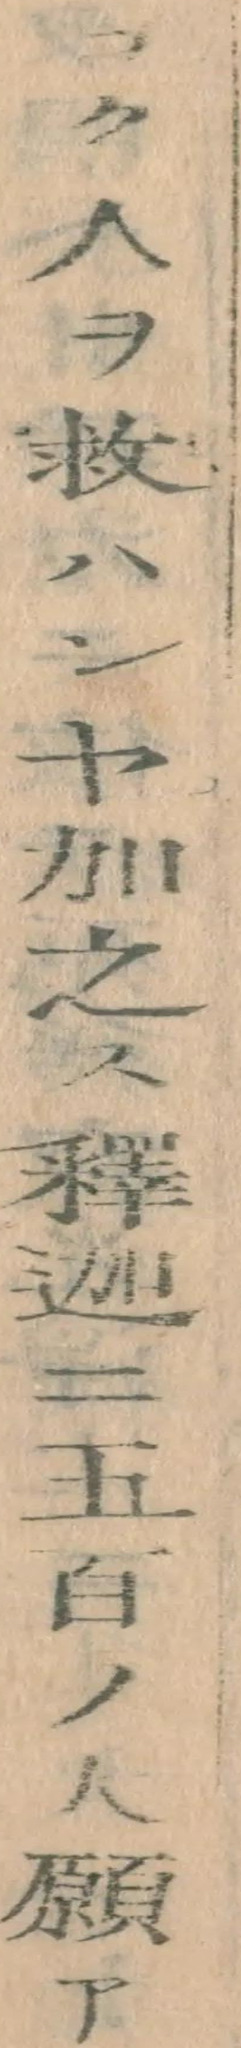ヨク人ヲ救ハンヤ。加之ス釈迦ニ五百ノ人願ア
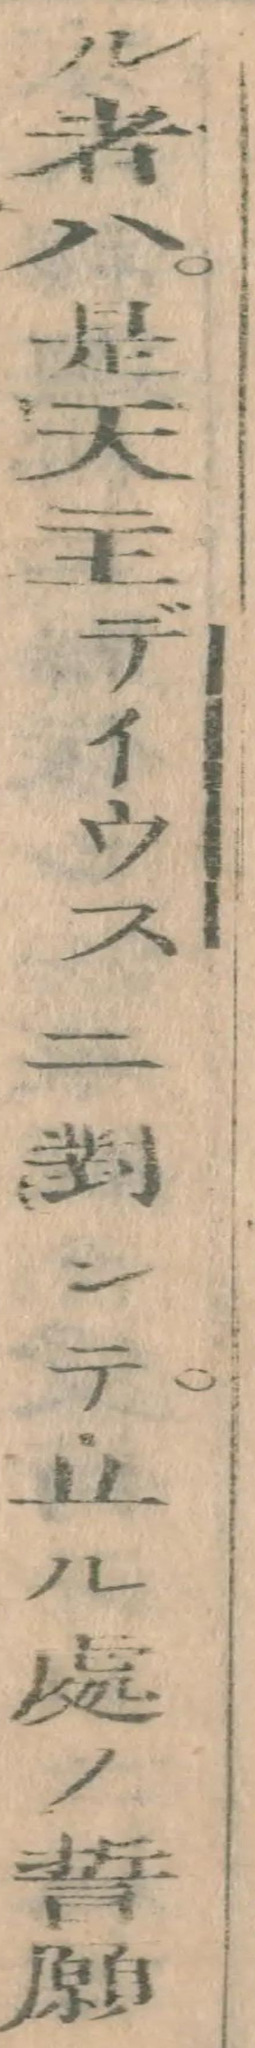ル者ハ。是天主デイウスニ対シテ。立ル処ノ誓願
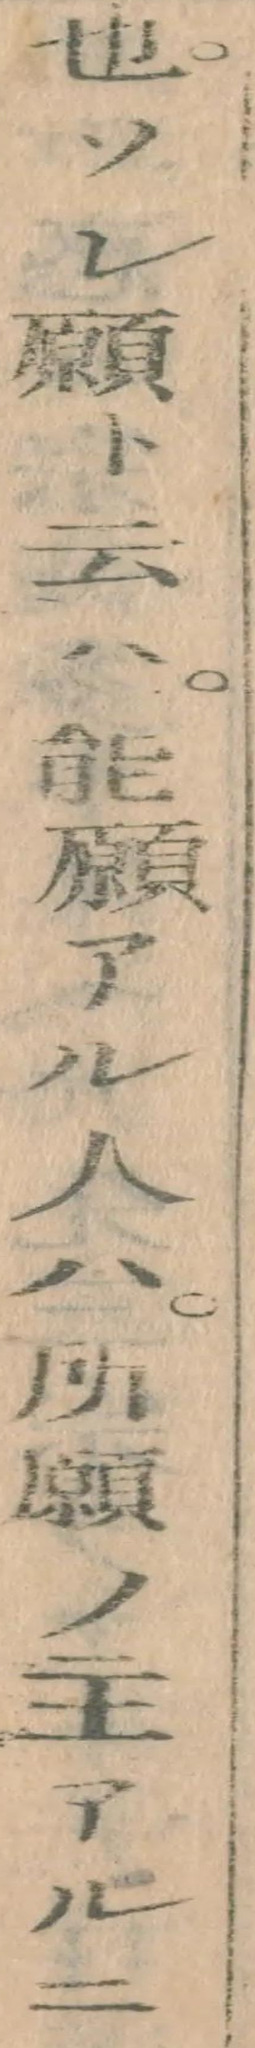也。ソレ願ト云ハ。能願アル人ハ。所願ノ主アルニ
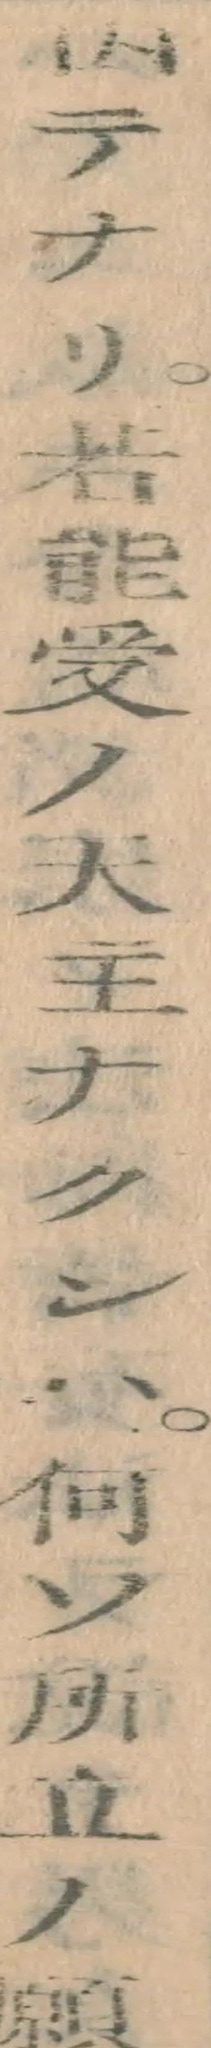因テナリ。若能受ノ天主ナクンハ。何ソ所立ノ願
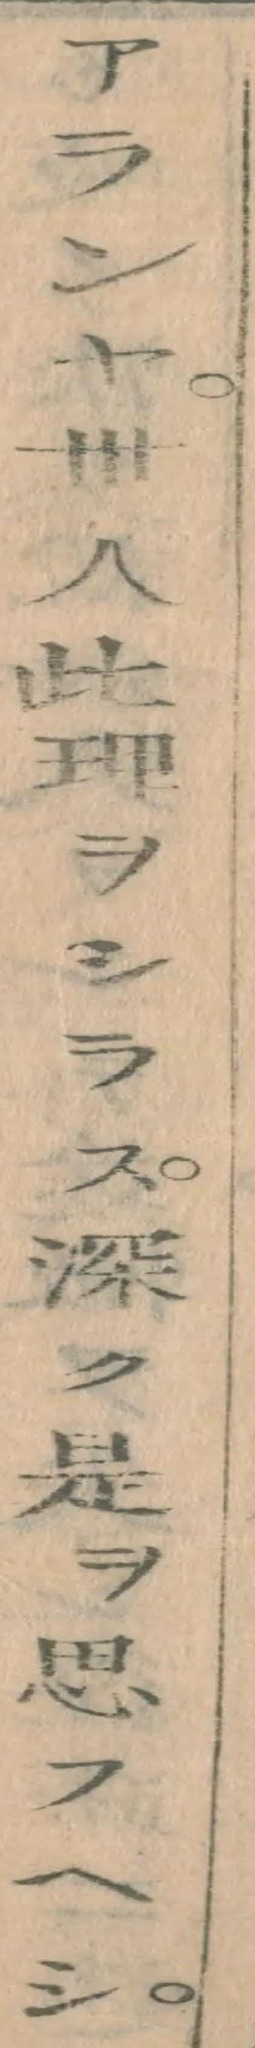アランヤ。世人此理ヲシラス。深ク是ヲ思フヘシ。
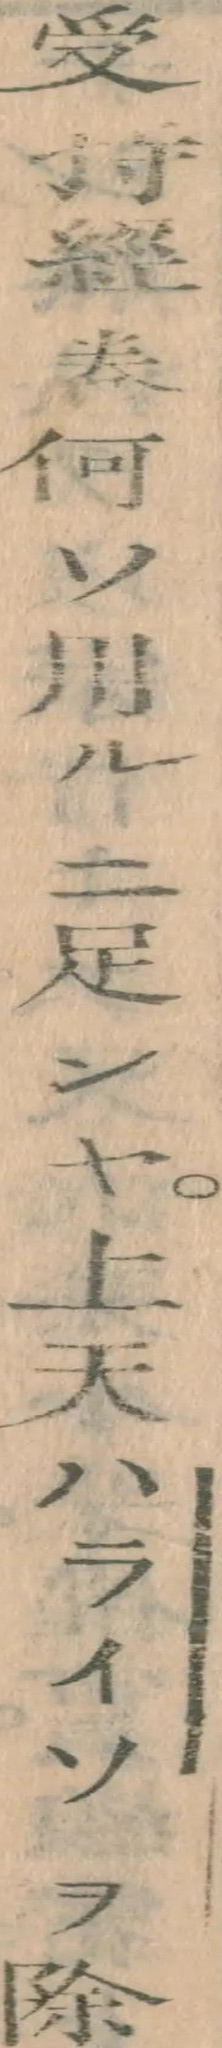受持経巻何ソ用ルニ足ンヤ。上天ハライソヲ除
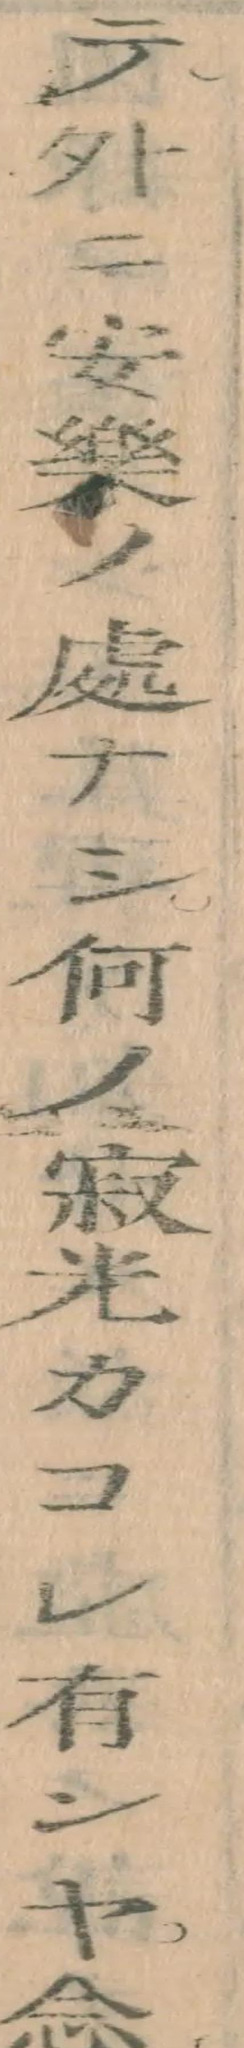テ。外ニ安楽ノ処ナシ。何ノ寂光カコレ有ンヤ。念
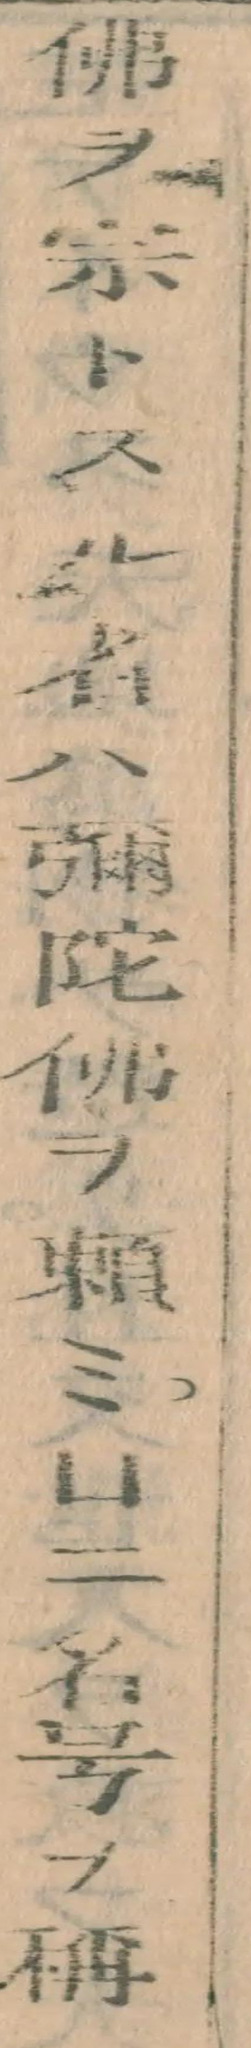仏ヲ宗トスル者ハ弥陀仏ヲ頼ミ。口ニ名号ヲ称
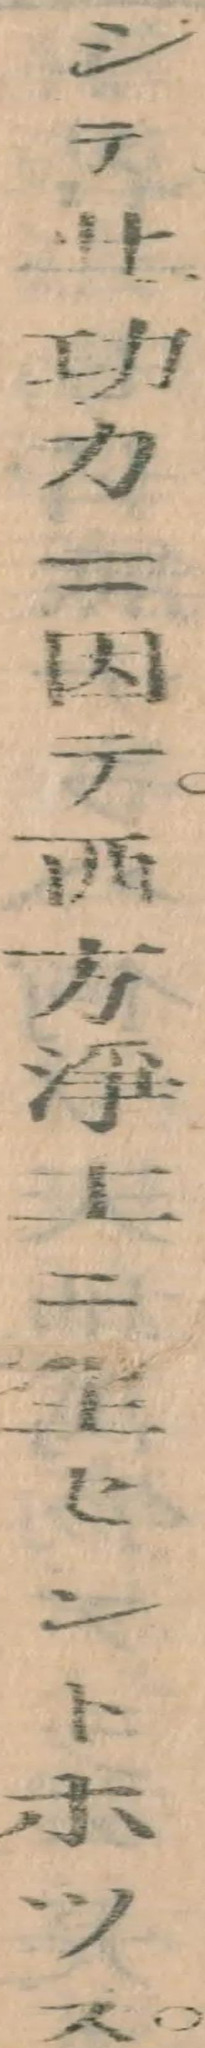シテ。此功力ニ因テ。西方浄土ニ生セントホツス。
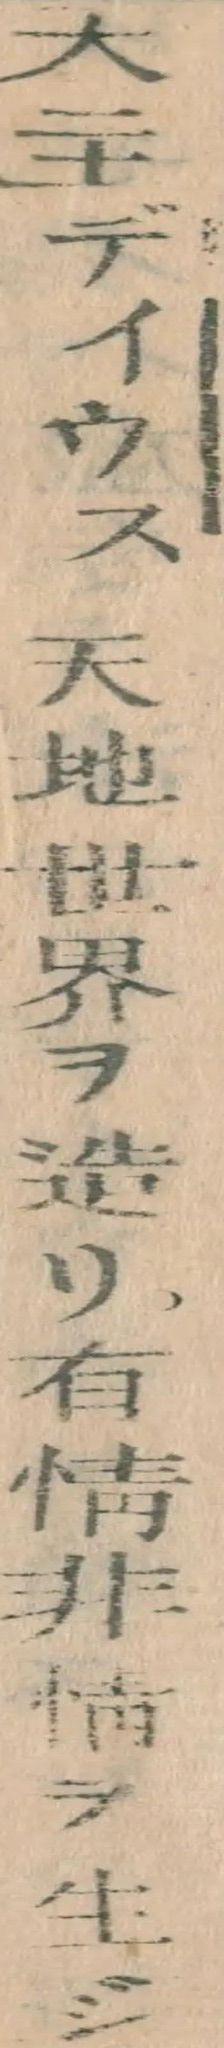天主デイウス天地世界ヲ造リ。有情非情ヲ生ジ
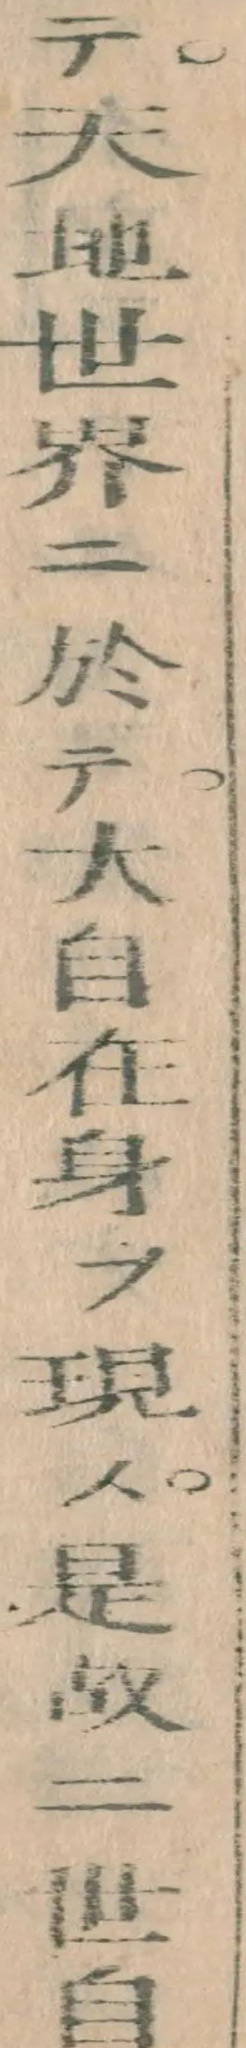テ。天地世界ニ於テ。大自在身ヲ現ス。是故ニ世自
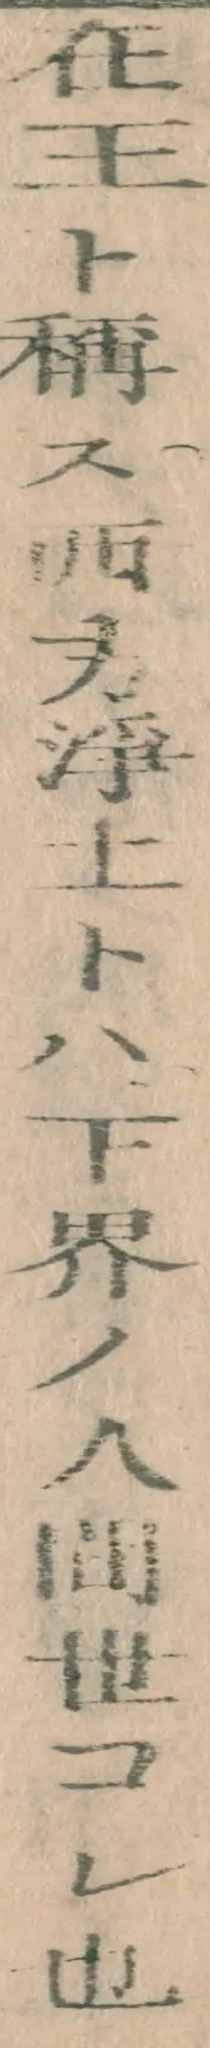在王ト称ス。西方浄土トハ。下界ノ人間世コレ也
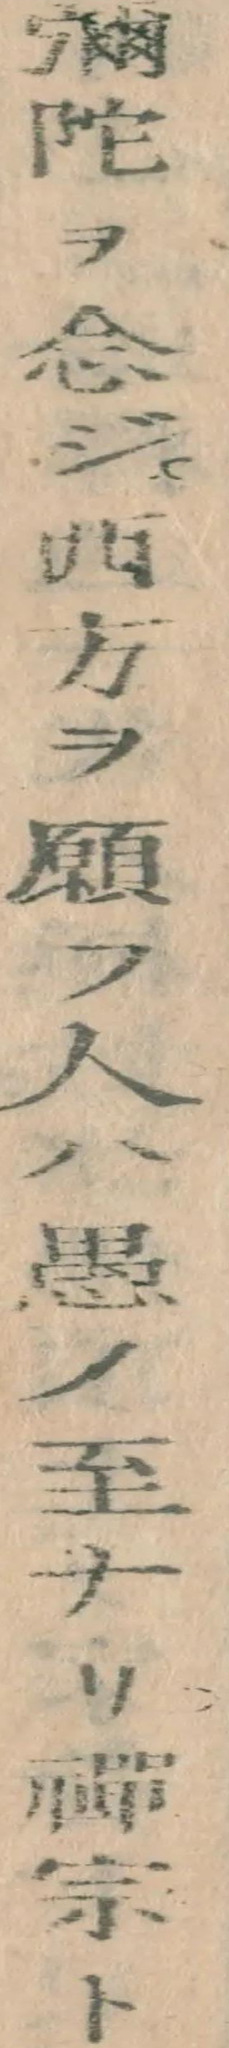弥陀ヲ念ジ。西方ヲ願フ人ハ愚ノ至ナリ。禅宗ト
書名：南蛮寺興廃記
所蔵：国立国会図書館 National Diet Library, JAPAN
